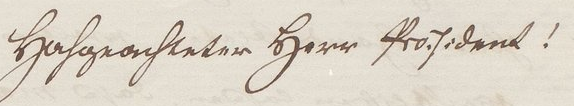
Hochgeachteter Herr Präsident!
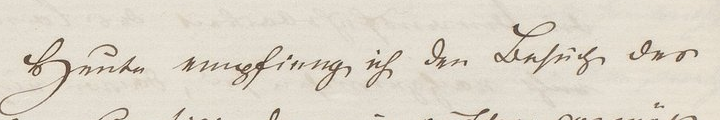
Heute empfieng ich den Bericht des
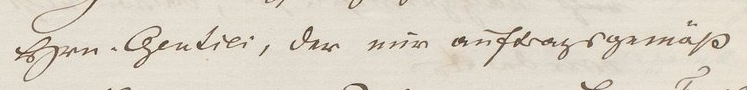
Hrn. Gentili, der mir auftragsgemäß
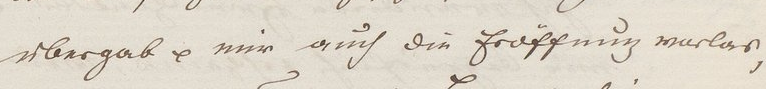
übergab & mir auch die Eröffnung vorlas,
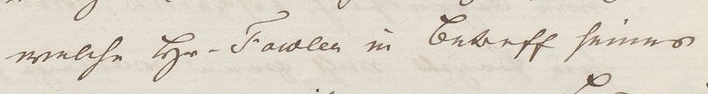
welche Hr. Fowler in Betreff seines
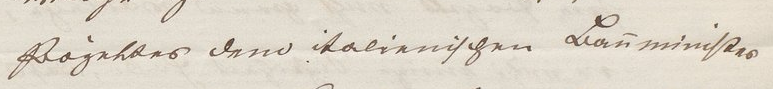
Projektes dem italienischen Bauminister
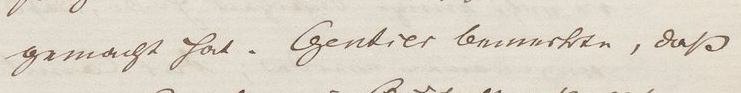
gemacht hat. Gentili bemerkte, daß
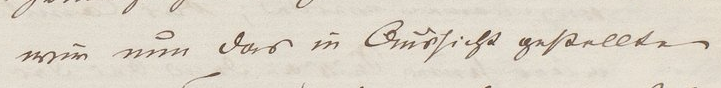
wir nun das in Aussicht gestellte
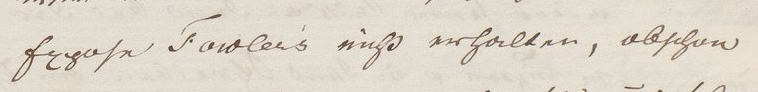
Expose Fowler's nicht erhalten, obschon
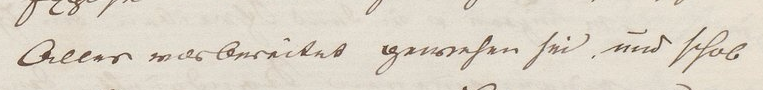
Alles vorbereitet gewesen sei, und schob
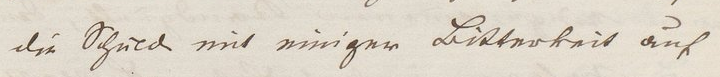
die Schuld mit einiger Bitterkeit auf
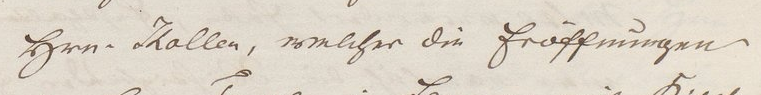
Hrn. Koller, welcher die Eröffnungen
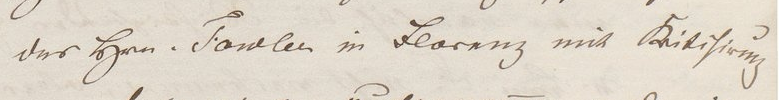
des Hrn. Fowler in Florenz mit Kritisirung
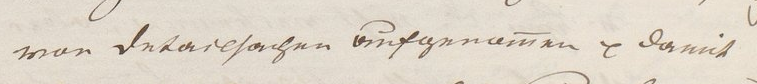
von Detailsachen aufgenommen & damit
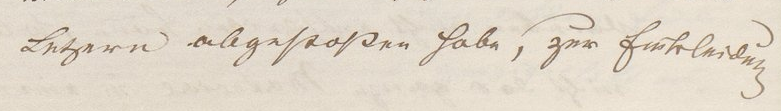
Letzern abgestoßen habe, zur Einkleidung
